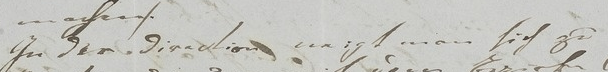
In der Direction neigt man sich zu
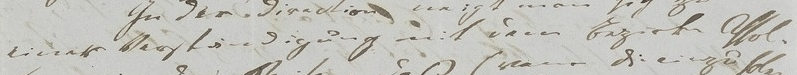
einer Verständigung mit dem Bezirke Affol-
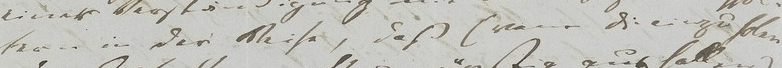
tern in der Weise, daß (wenn die einzuholen-
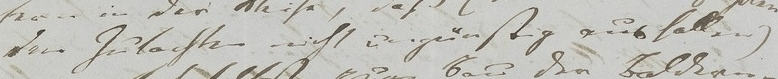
den Gutachten nicht ungünstig ausfallen)
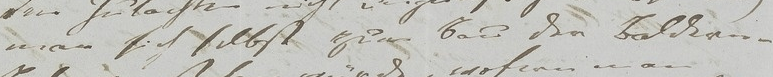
man sich selbst zum Bau der Baldern-
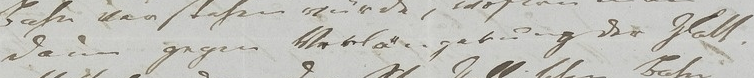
dann gegen Verlängerung der Glatt-
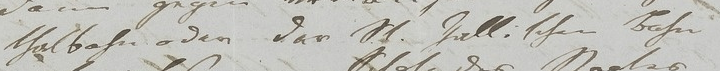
thalbahn oder der St. Gallischen Bahn
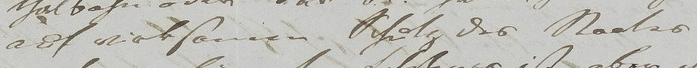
auf wirksamen Schutz des Staates
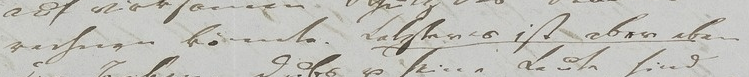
rechnen könnte. Letzteres ist aber eben
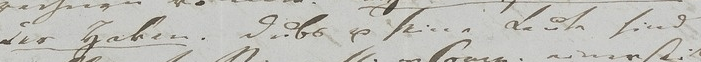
der Haken. Dubs & seine Leute sind
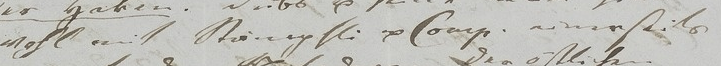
wohl mit Stämpfli & Comp. einerseits
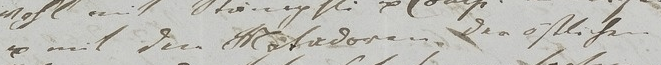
& mit den Matadoren der östlichen
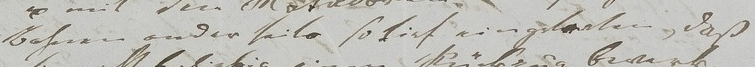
Bahnen anderseits so tief eingetreten, daß
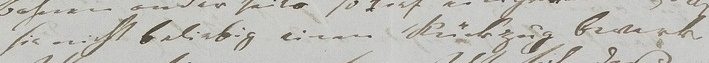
sie nicht beliebig einen Rückzug bewerk-
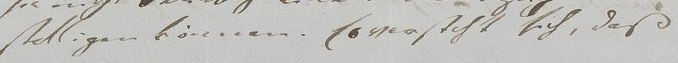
stelligen können. Es versteht sich, daß
